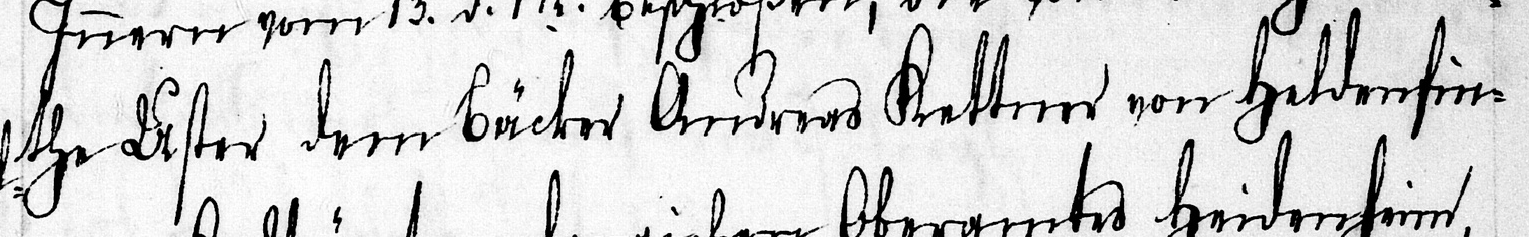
the Uster dem Bäcker Andreas Kettner von Heldenfin¬
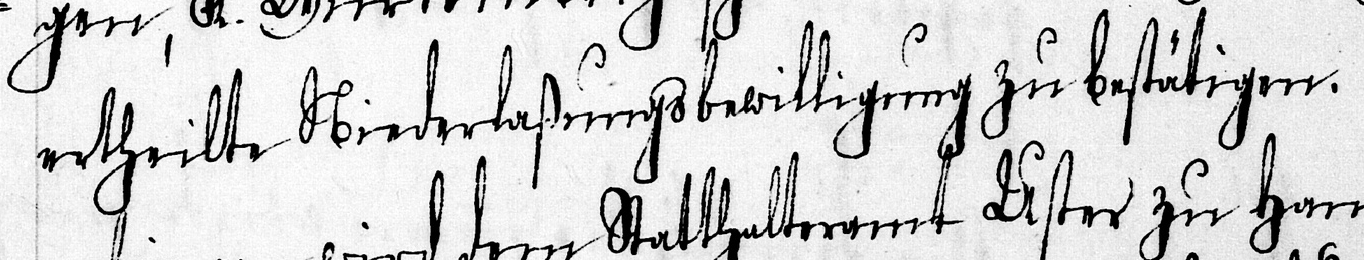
ertheilte Niederlaßungsbewilligung zu bestätigen.
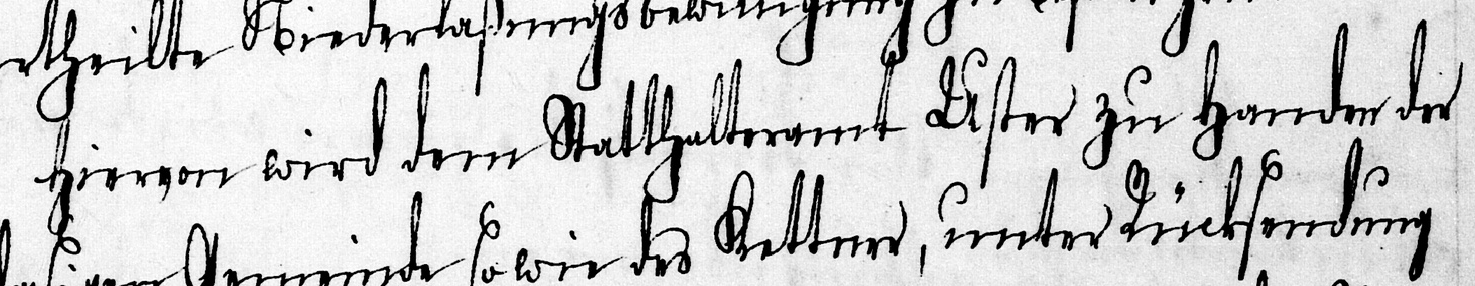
Hiervon wird dem Statthalteramt Uster zu Handen der
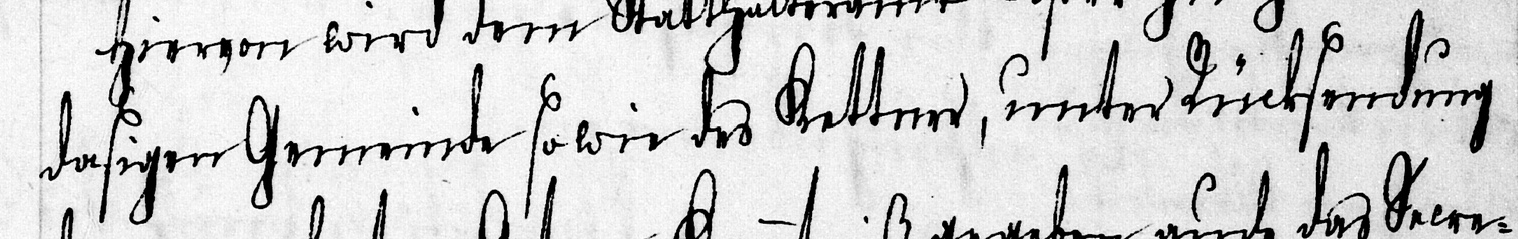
dasigen Gemeinde sowie des Kettner, unter Rücksendung
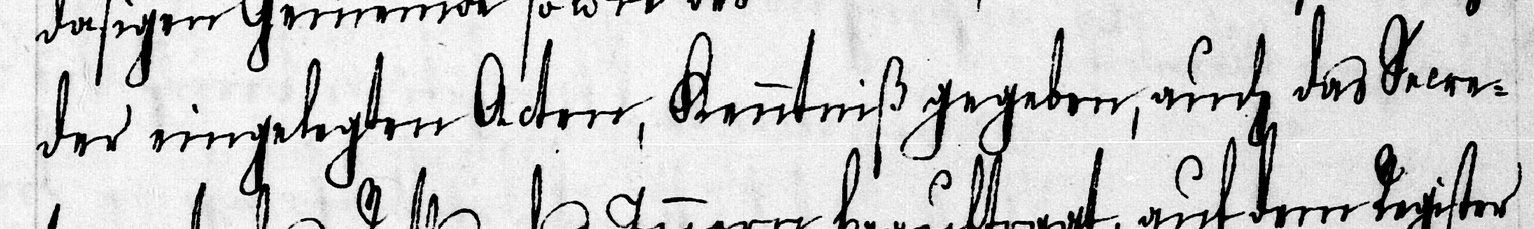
der eingelegten Acten, Kenntniß gegeben, auch das Secre¬
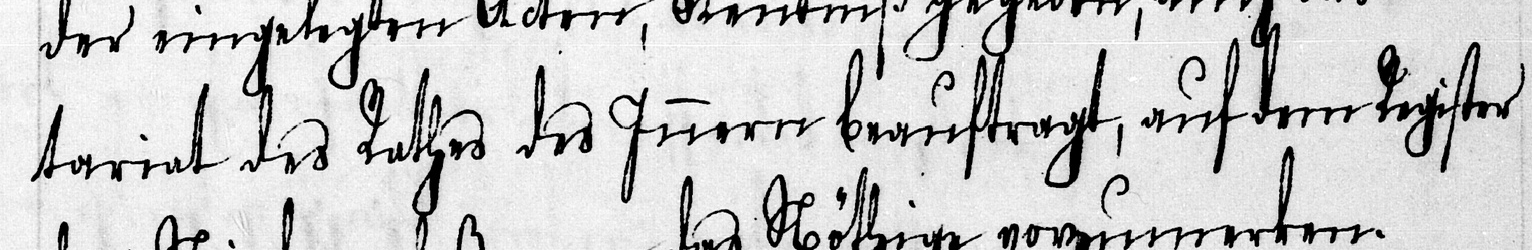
tariat des Rathes des Innern beauftragt, auf dem Register
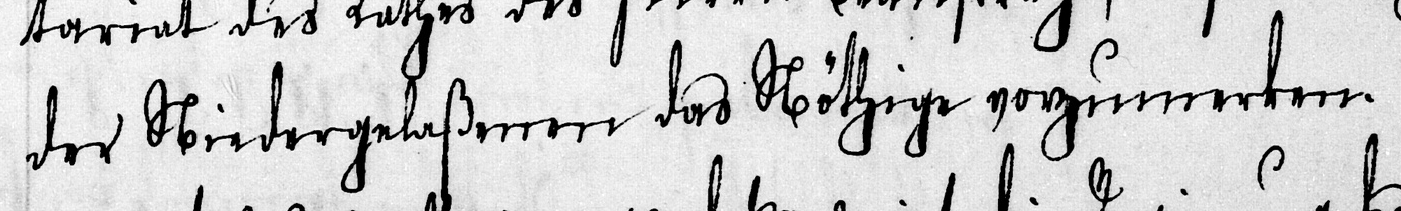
der Niedergelaßenen das Nöthige vorzumerken.
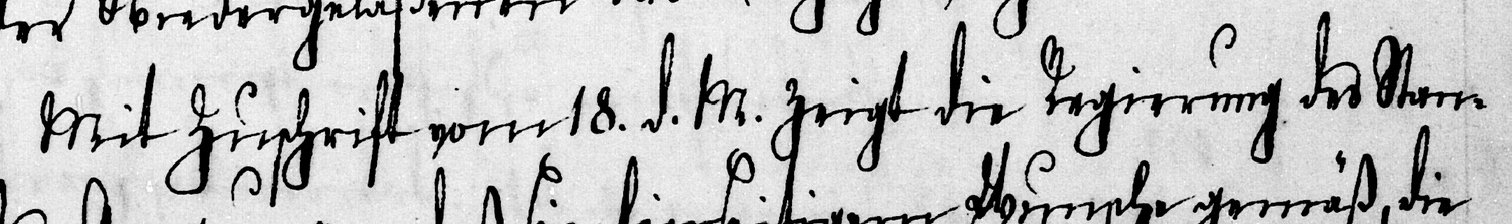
Mit Zuschrift vom 18. d. M. zeigt die Regierung des Stan¬
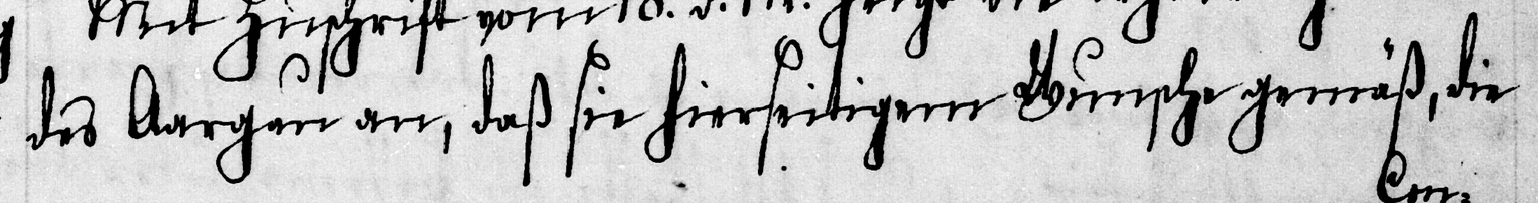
des Aargau an, daß sie hierseitigem Wunsche gemäß, die
